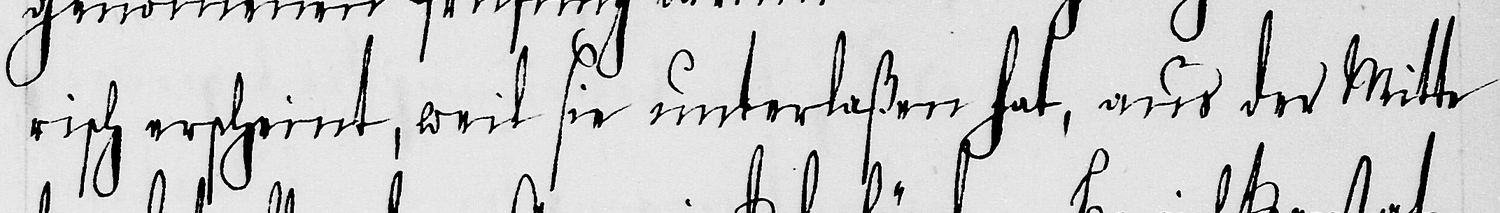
risch erscheint, weil sie unterlaßen hat, aus der Mitte
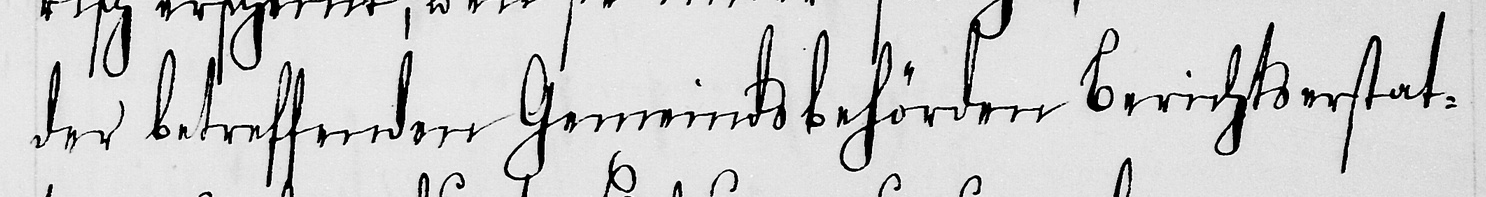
der betreffend Gemeindsbehörden Berichtserstat¬
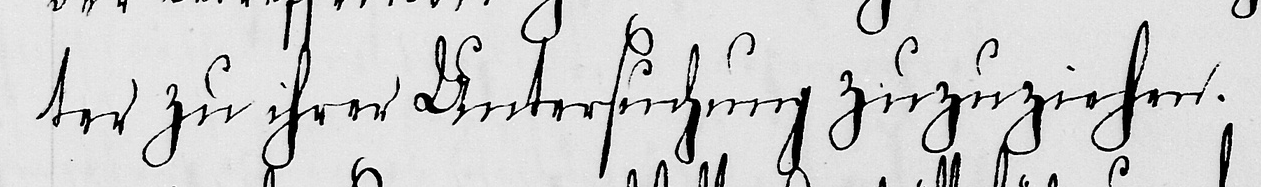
ter zu ihrer Untersuchung zuzuziehen.
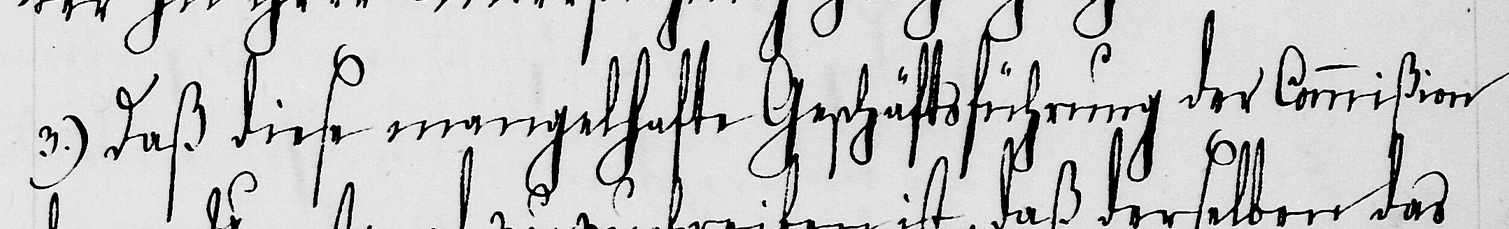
3.) Daß diese mangelhafte Geschäftsführung der Commißi¬
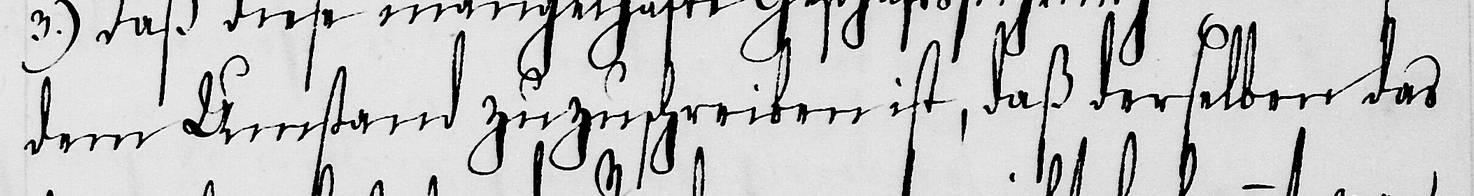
dem Umstand zuzuschreiben ist, daß derselben das
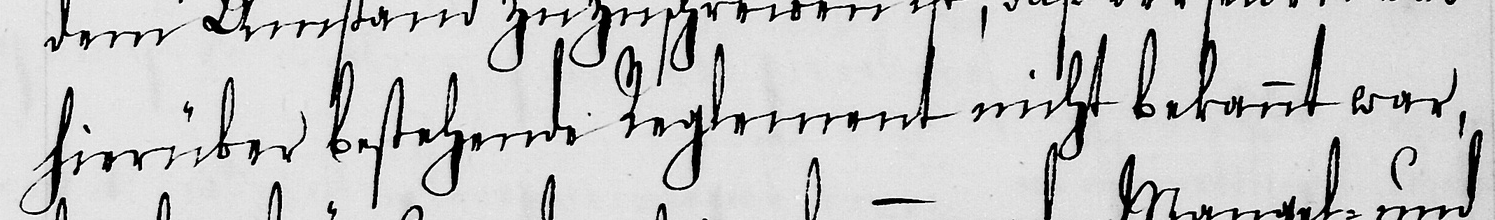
hierüber bestehende Reglement nicht bekannt war,
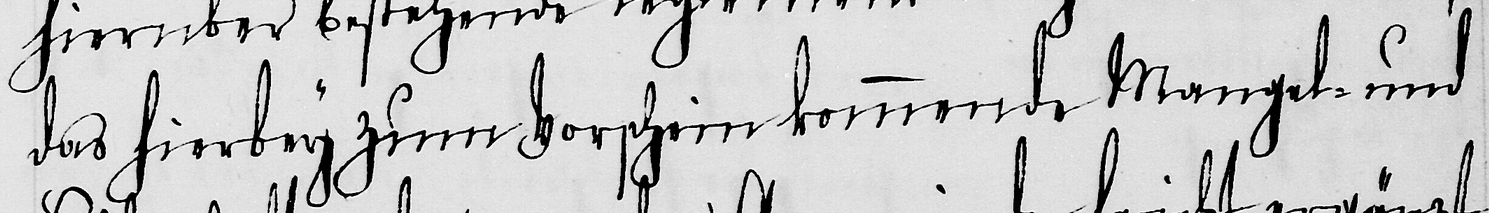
das hierbey zum Vorschein kommende Mangel- und
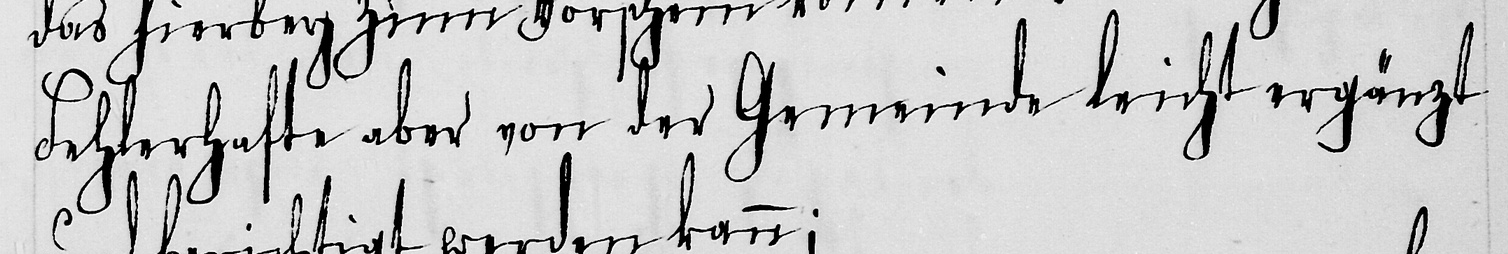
Fehlerhafte aber von der Gemeinde leicht ergänzt
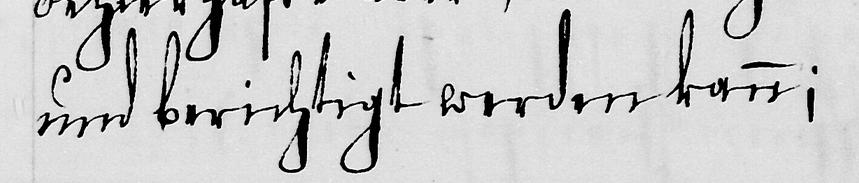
und berichtigt werden kann;
